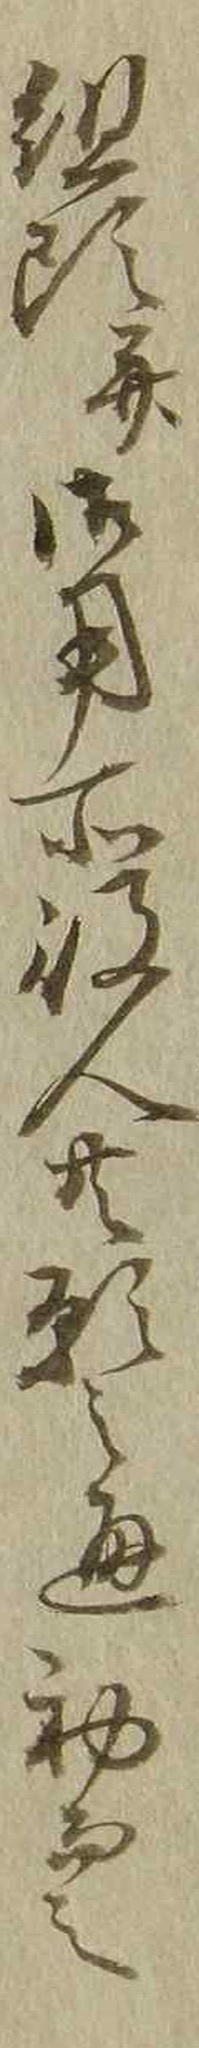組頭幷御用所役人共願之通初而之
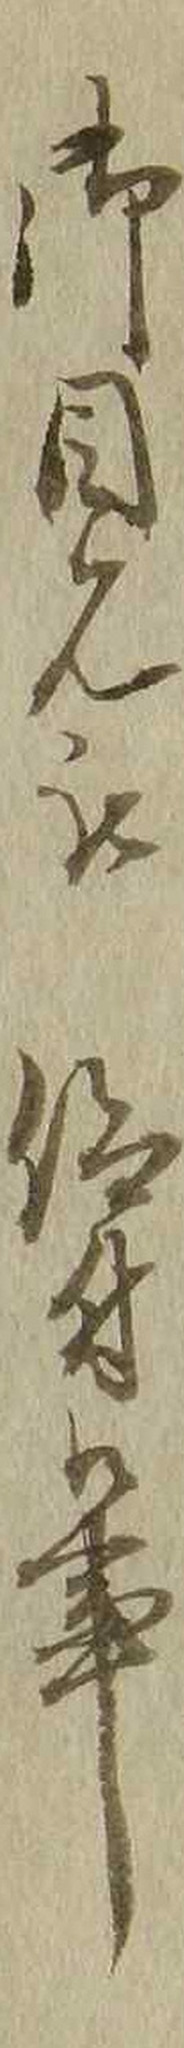御目見被仰付候事
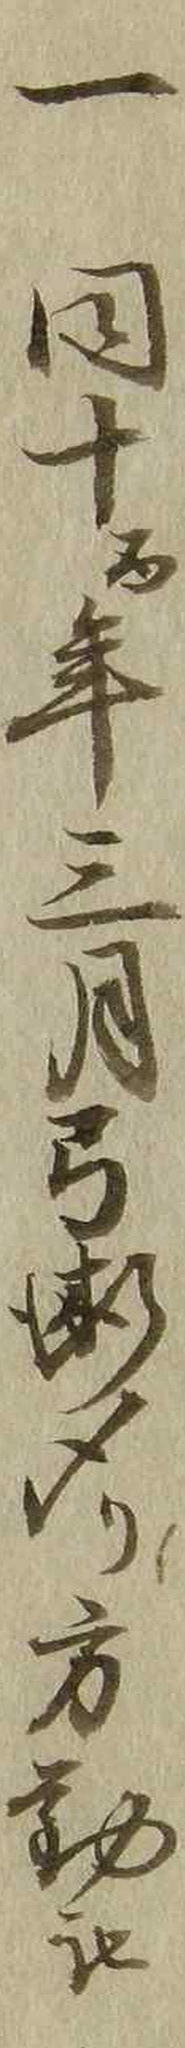一同十酉年三月弓断〆り方勤被
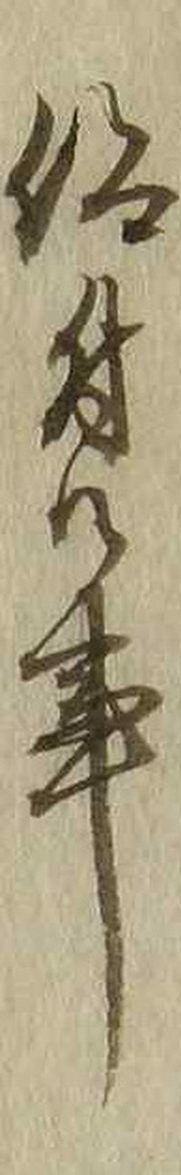仰付候事
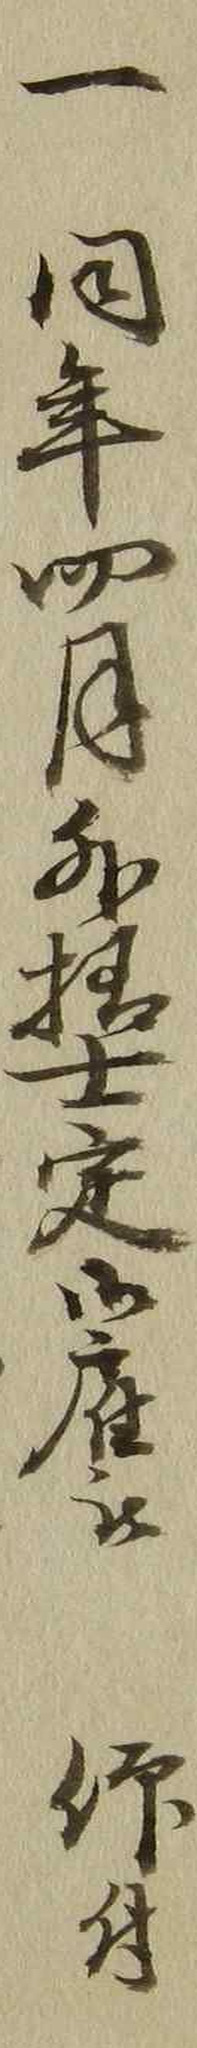一同年四月外様士定御雇被仰付
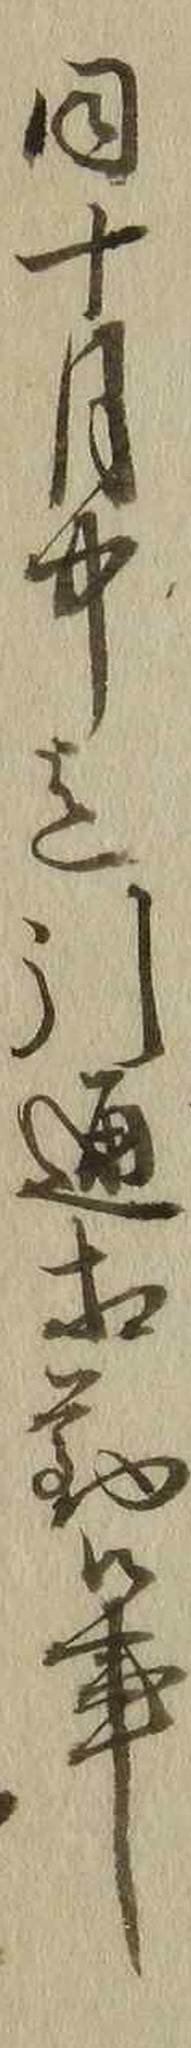同十月中迄引通相勤候事
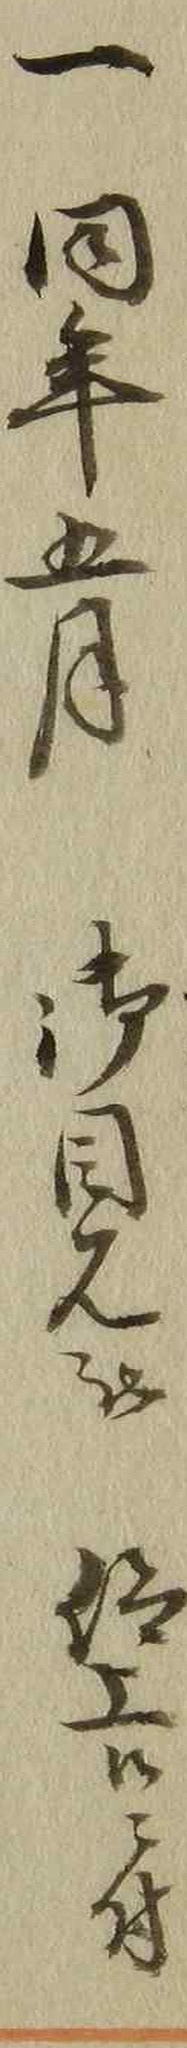一同年五月御目見被仰上候ニ付
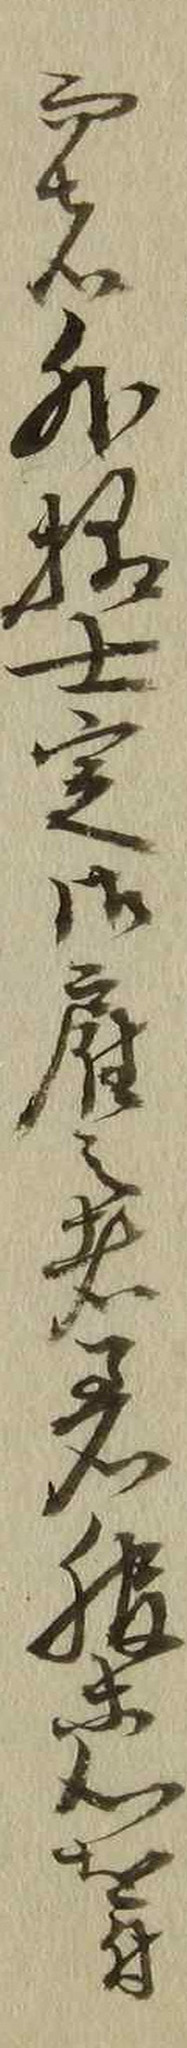而者外様士定御雇之者着服等心を付
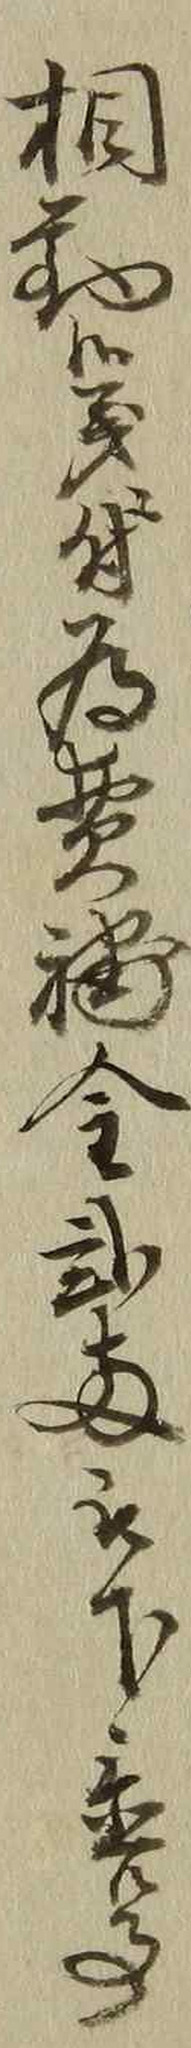相勤候義ニ付為費補金弐両被下置候事
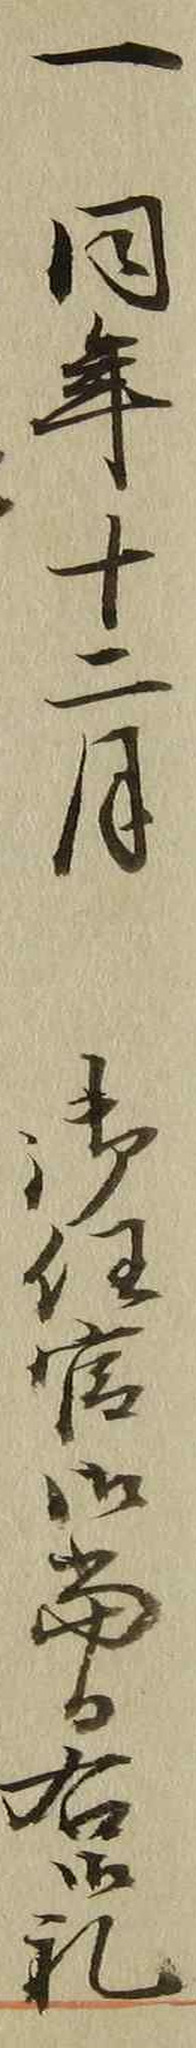一同年十二月御任官御当日右御礼
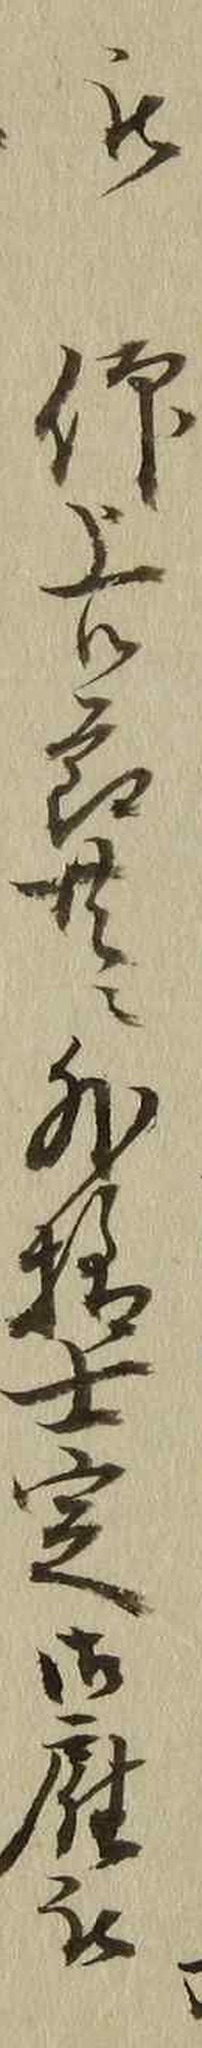被仰上候節共ニ外様士定御雇被
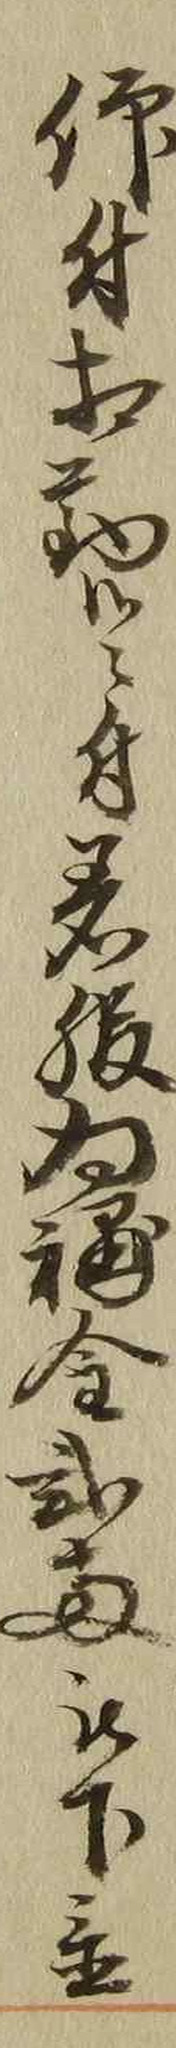仰付相勤候ニ付着服為補金弐両被下置
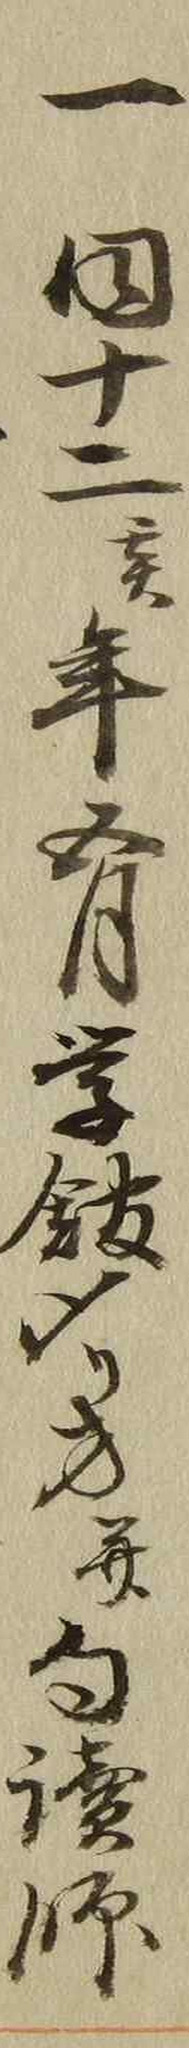一同十二亥年五月学館〆り方幷句読師
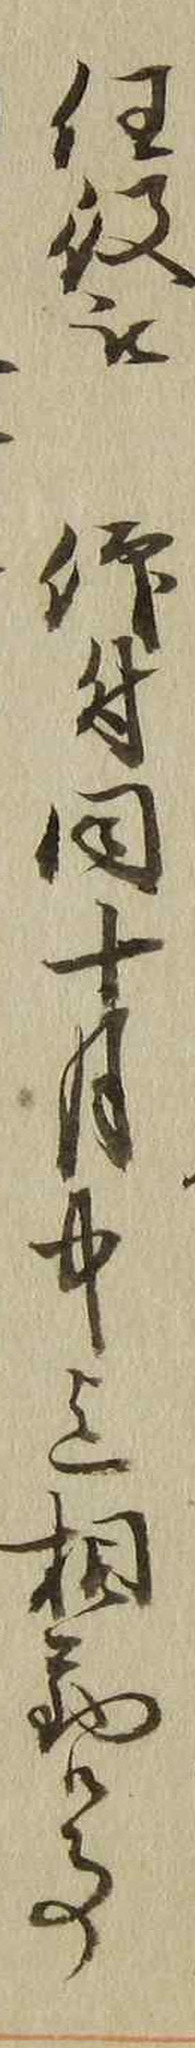任役被仰付同十月中迄相勤候事
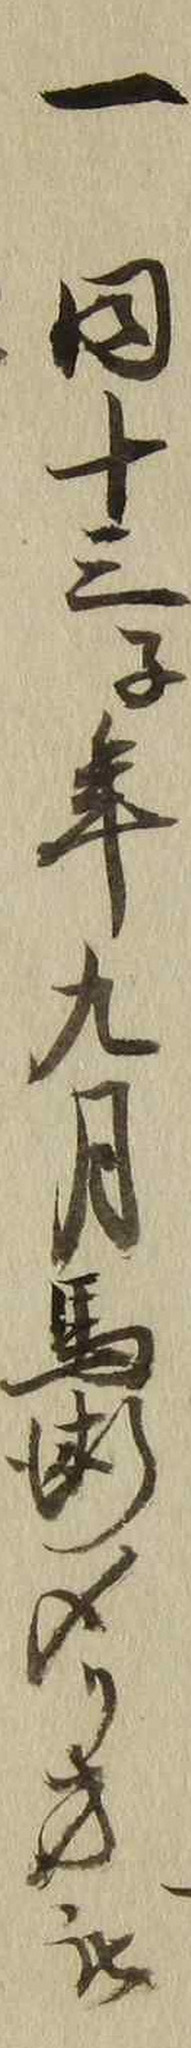一同十三子年九月馬術〆り方被
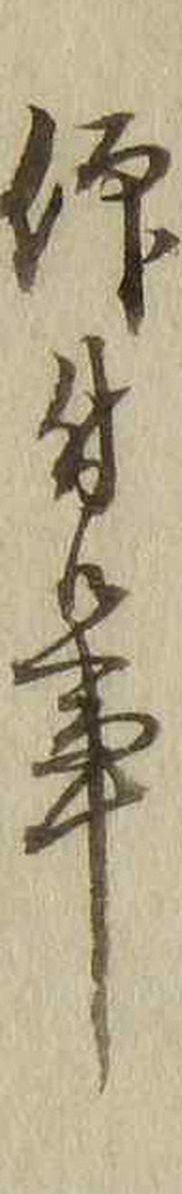仰付候事
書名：諸士系譜　巻之64　と之部7
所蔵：会津若松市立会津図書館
